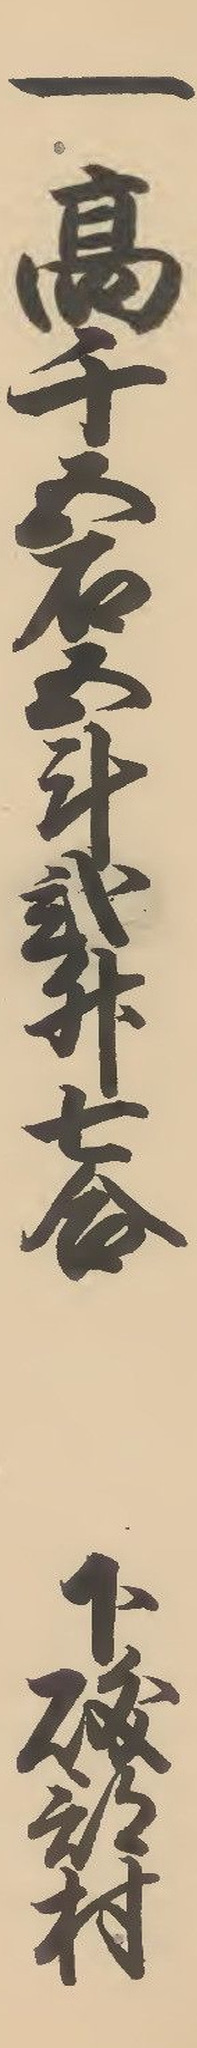一髙千五石五斗弐升七合下磯部村
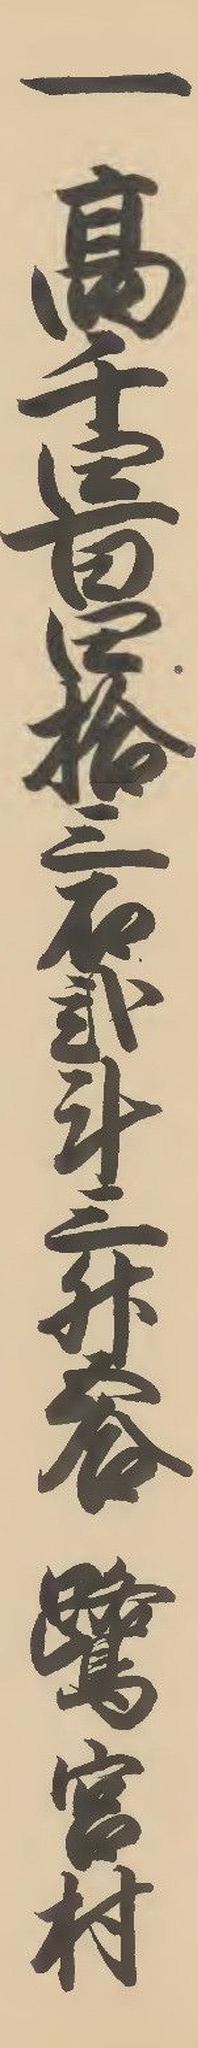一髙千四百四拾三石弐斗三升五合鷺宮村
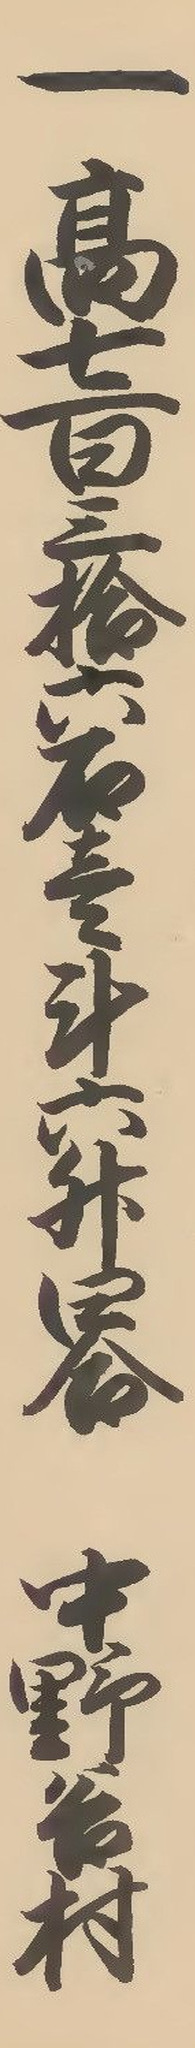一髙七百三拾六石壱斗六升四合中野谷村

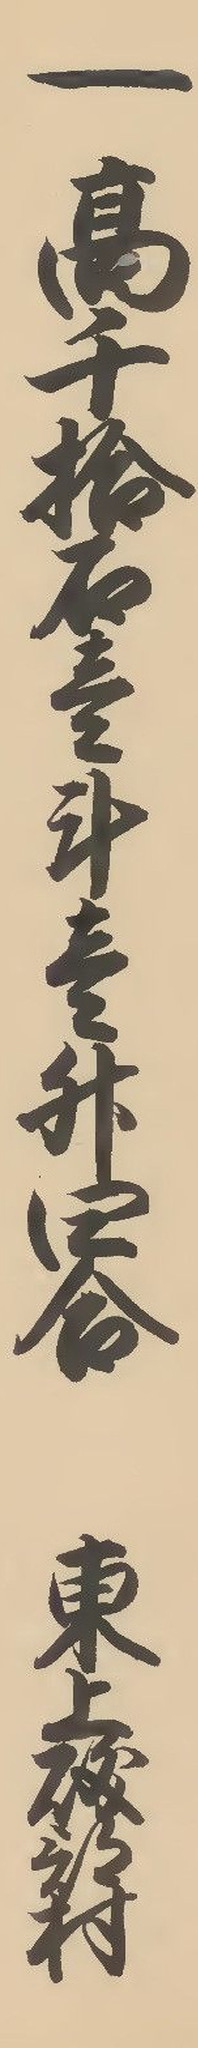一髙千拾石壱斗壱升四合東上磯部村
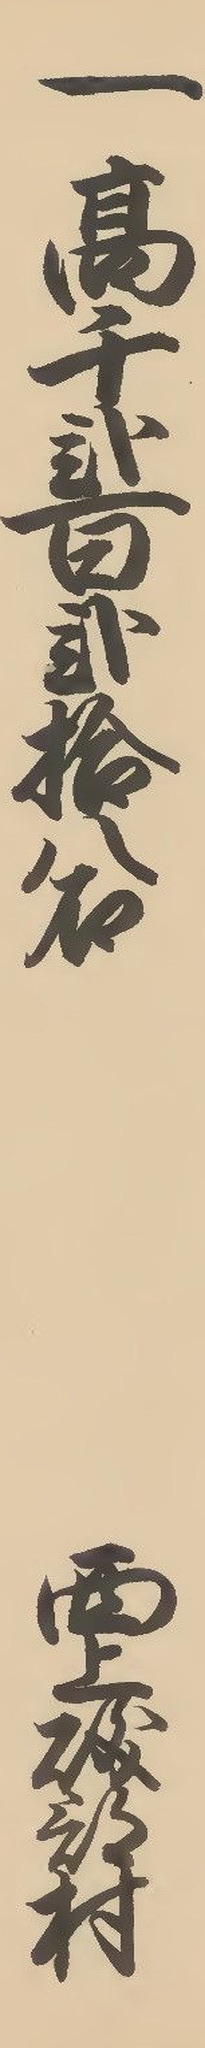一髙千弐百弐拾八石西上磯部村
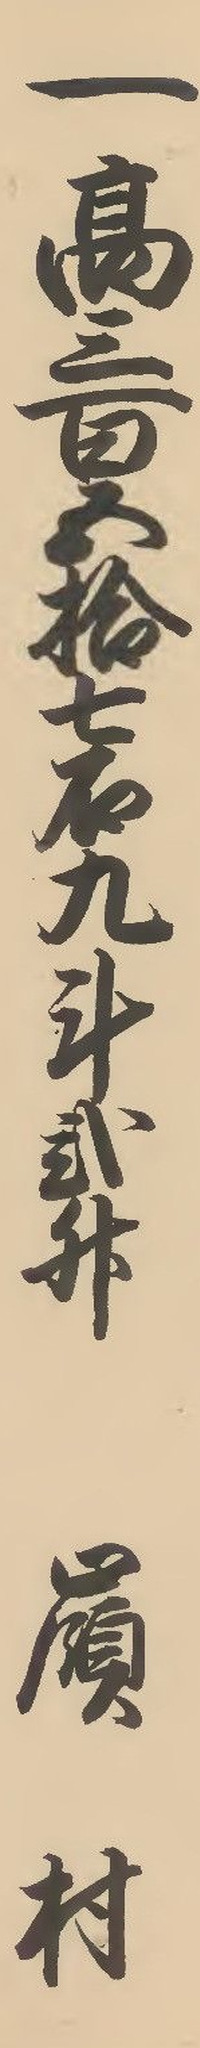一髙三百五拾七石九斗弐升嶺村
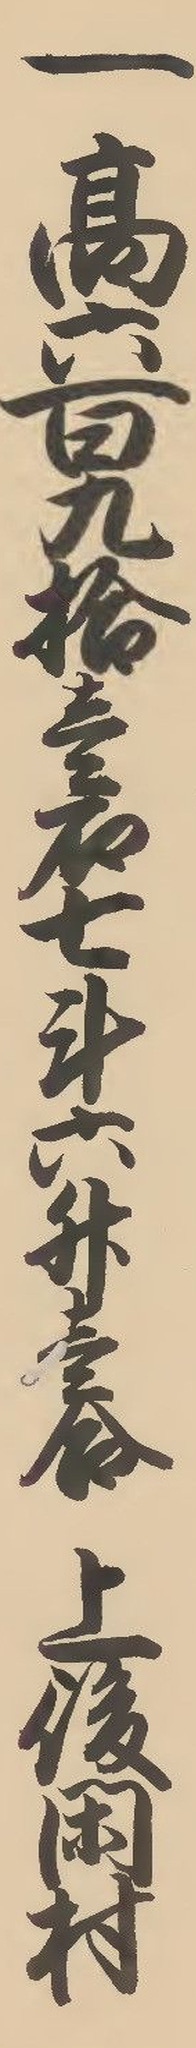一髙六百九拾壱石七斗六升壱合上後閑村
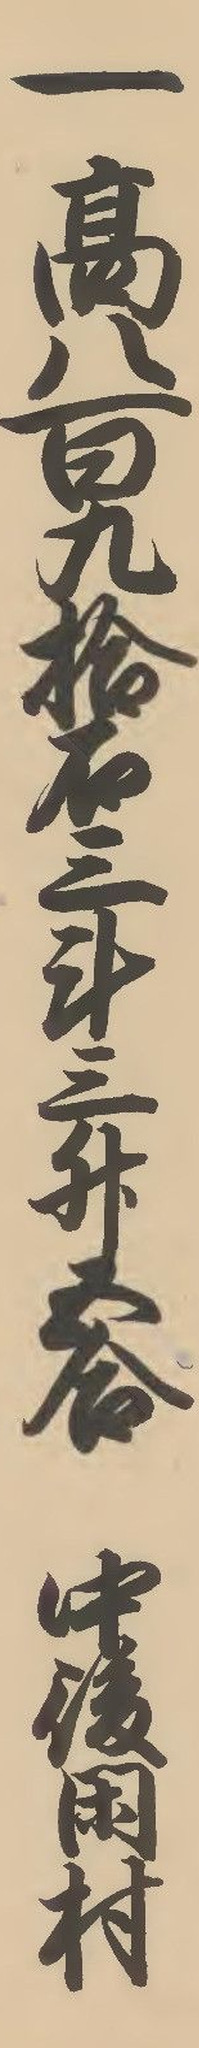一髙八百九拾石三斗三升五合中後閑村
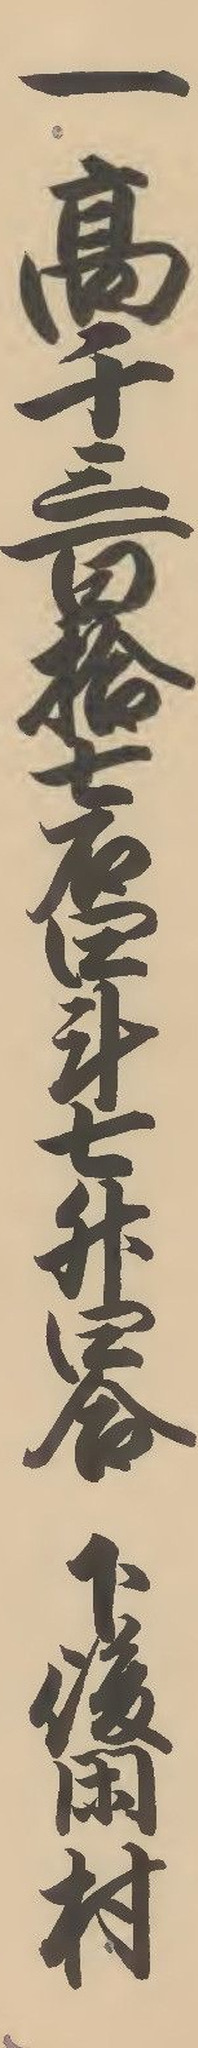一髙千三百拾七石四斗七升四合下後閑村
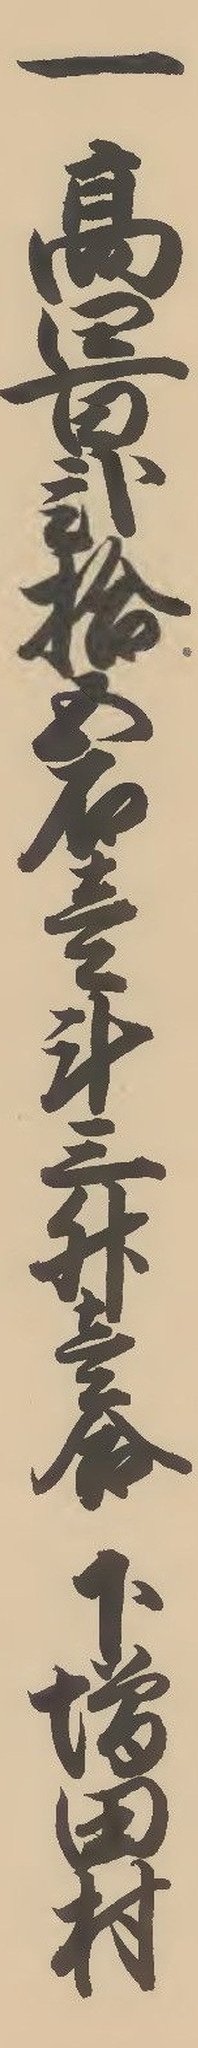一髙四百弐拾五石壱斗三升壱合下増田村
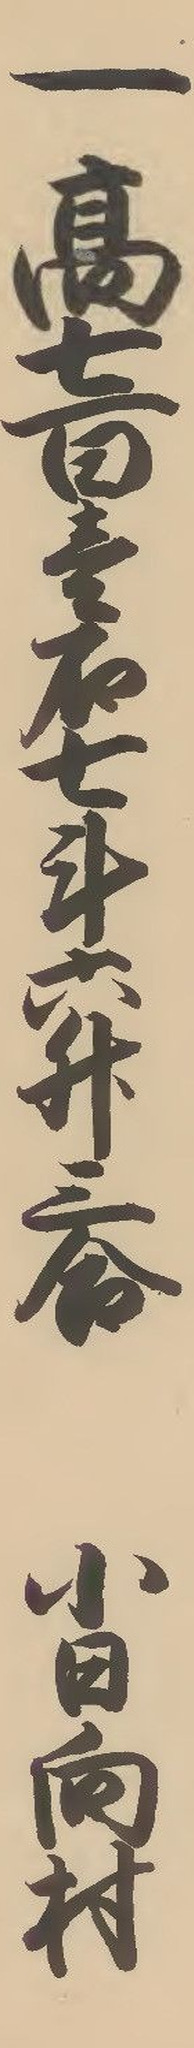一髙七百壱石七斗六升三合小日向村

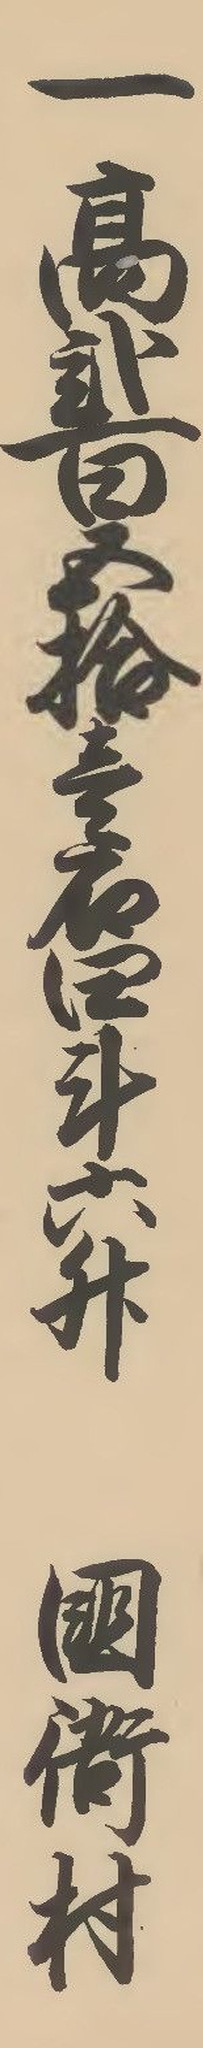一髙弐百五拾壱石四斗六升国衙村
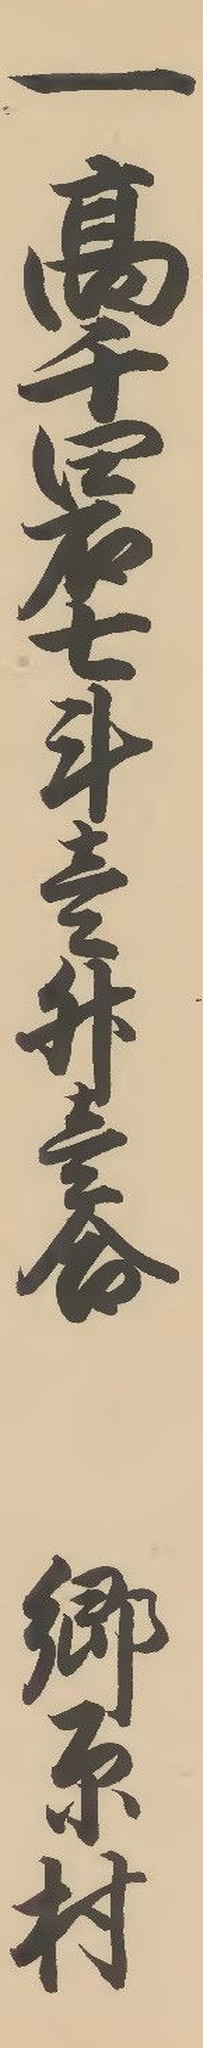一髙千四石七斗壱升壱合郷原村
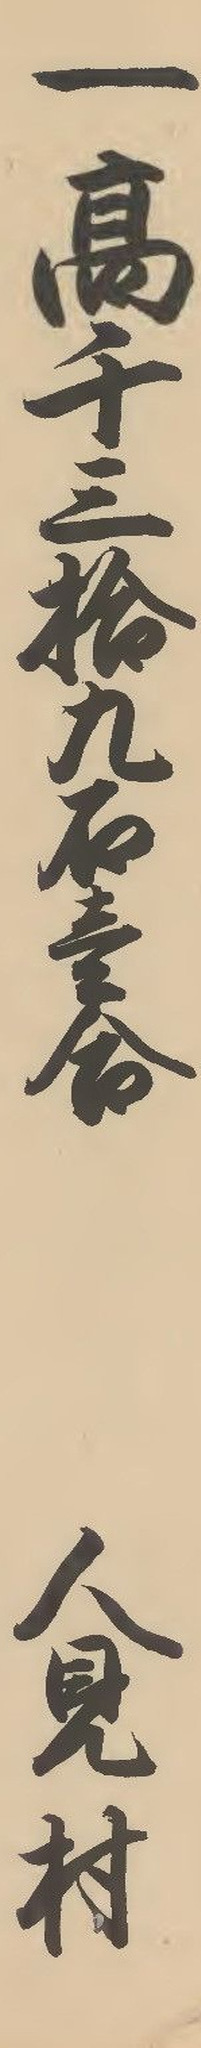一髙千三拾九石壱合人見村
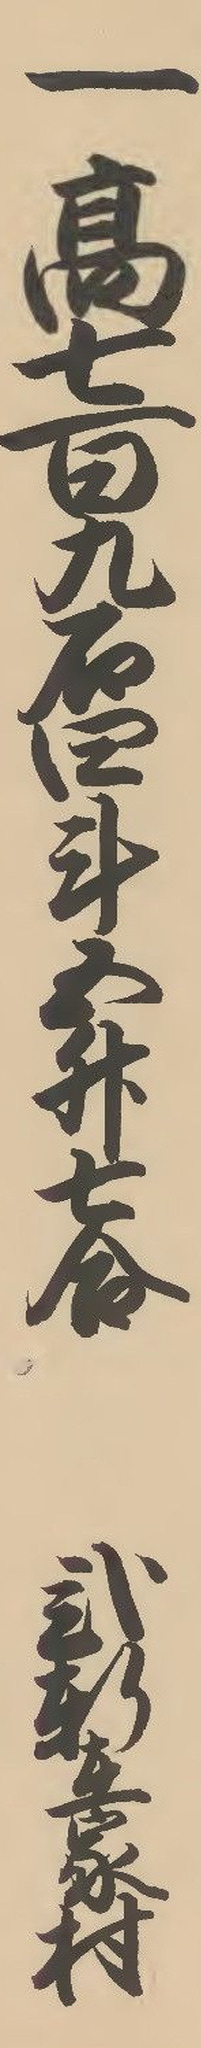一髙七百九石四斗五升七合弐軒在家村
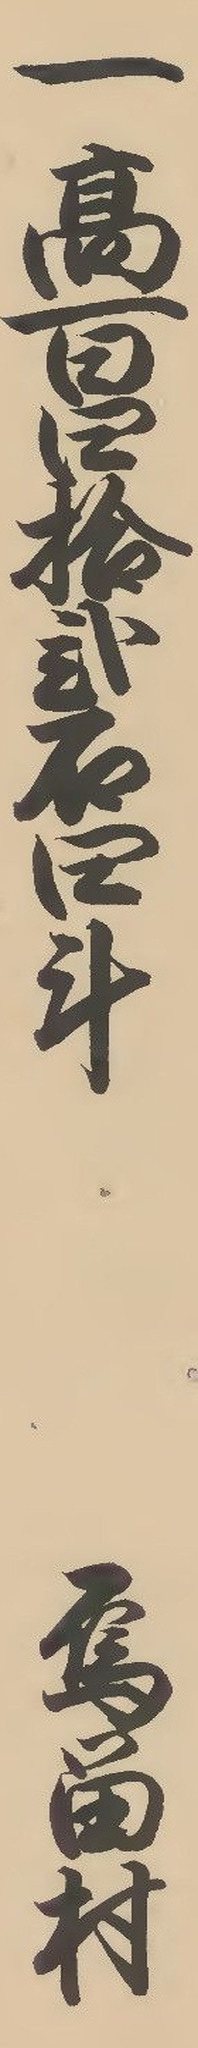一髙百四拾弐石四斗鳥留村
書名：上野国郷帳
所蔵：国立公文書館 National Archives of Japan
